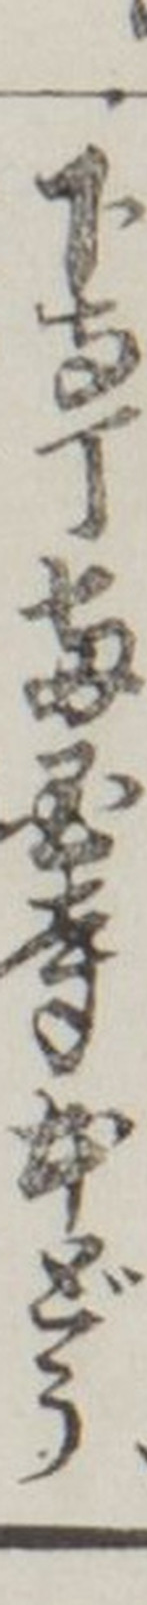下寺丁両国寺本どう
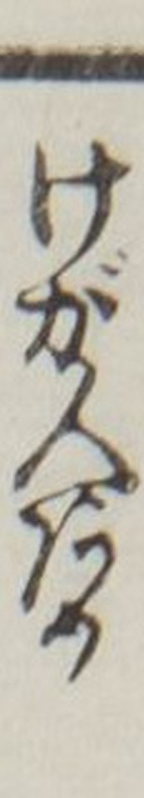けが人あり
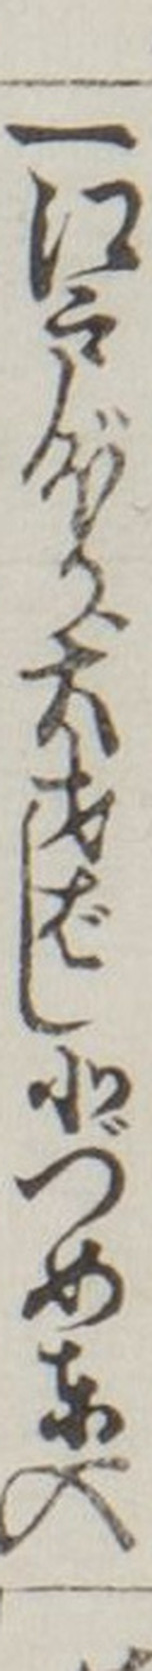一江戸ぼり犬才ばし北づめ東に入
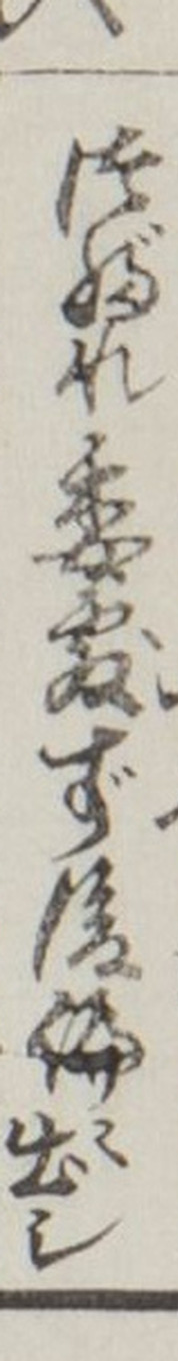つぶれ委敷ず後偏に出し
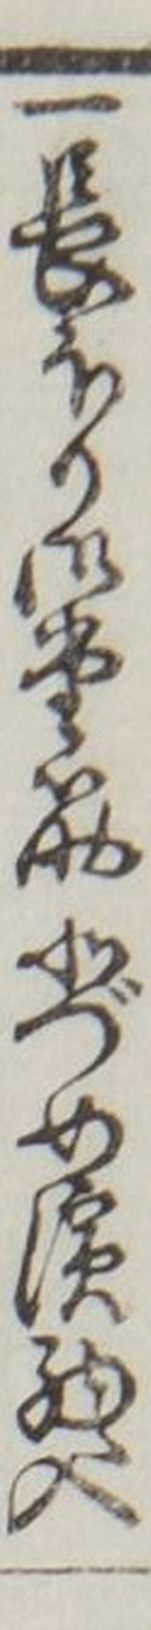一長ほり御堂筋北づめ浜西へ入
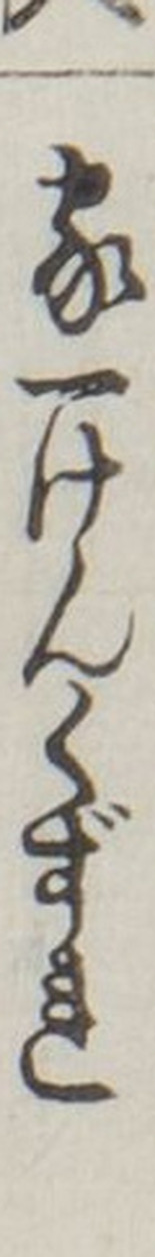家一けんくずれ
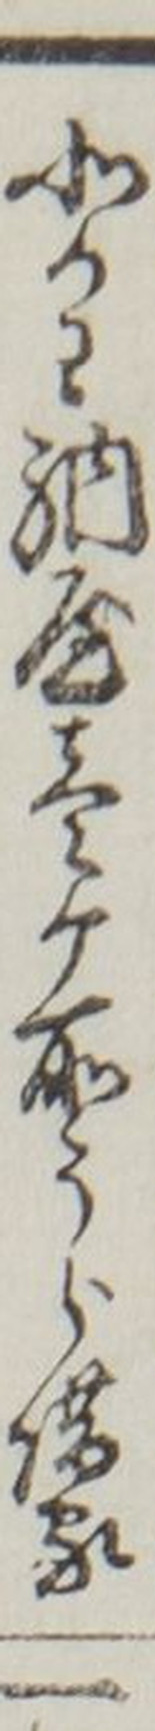北かわ納屋壱ヶ所うら借家
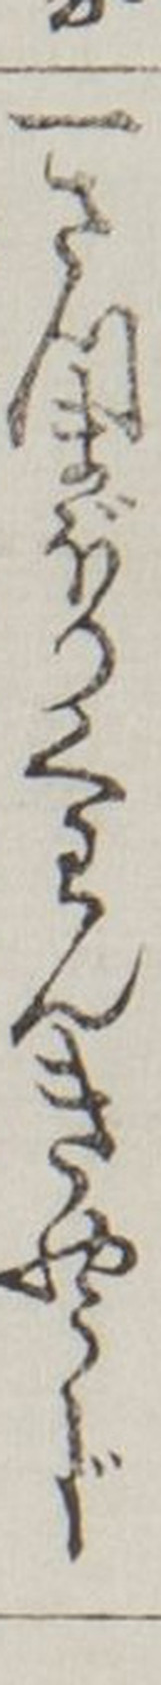一さつまぼりくわんきやうじ
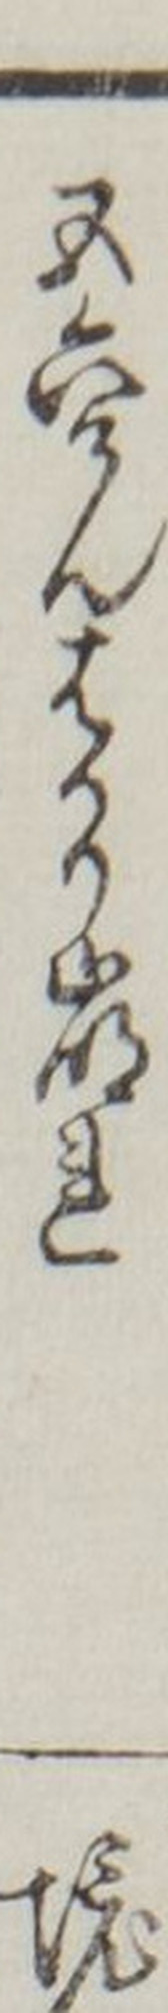又六けんはかり崩れ
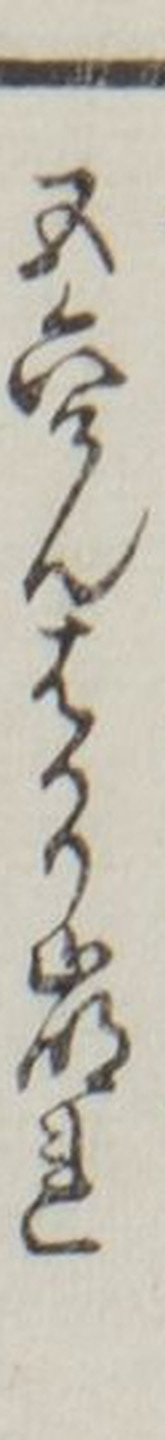又六けんはかり崩れ
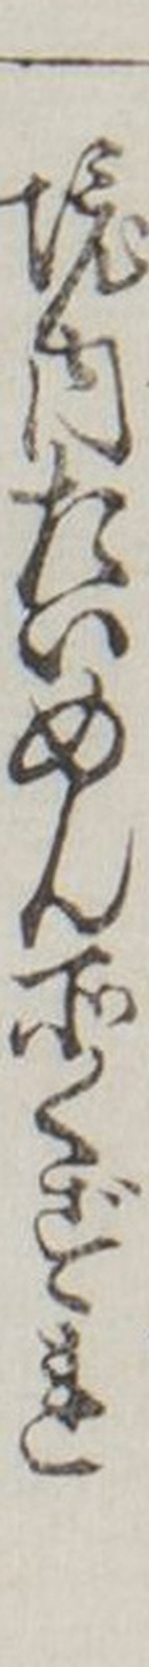境内たいめん所くずれ
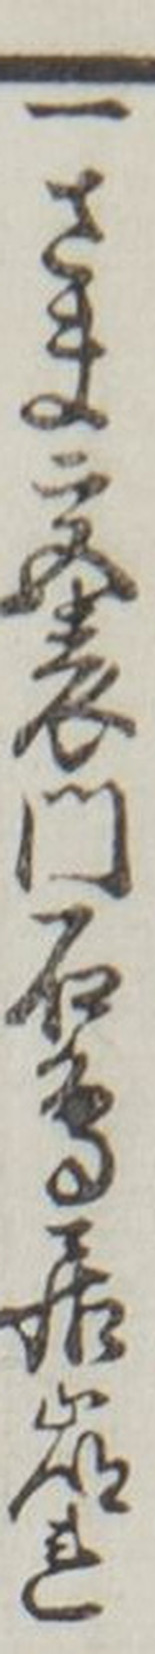一さま宮表門石鳥居崩れ
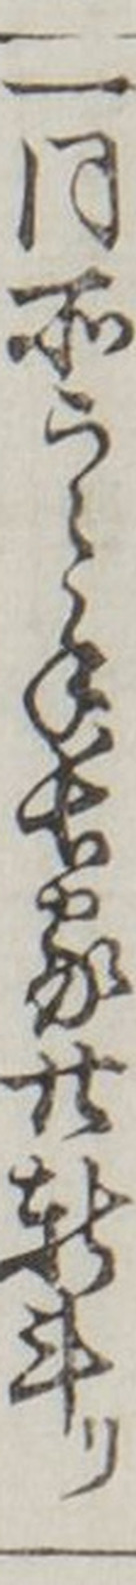一同所うら手長屋廿軒斗り
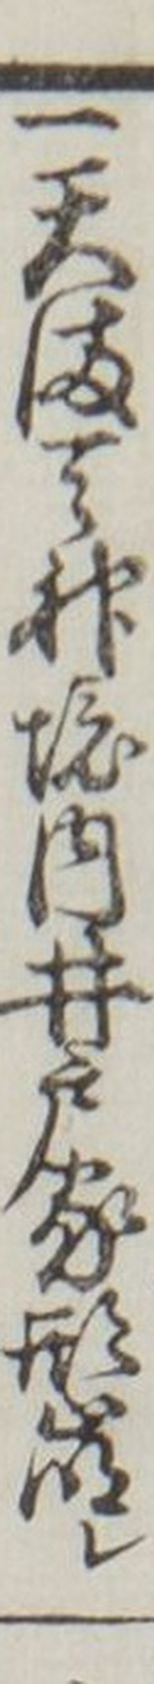一天満天神境内井戸家形崩れ
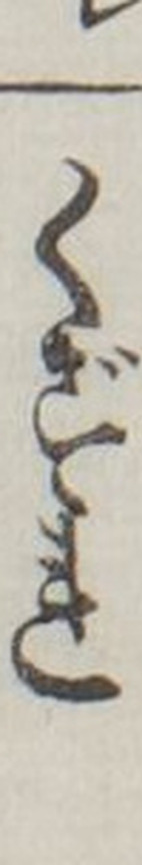くずれ
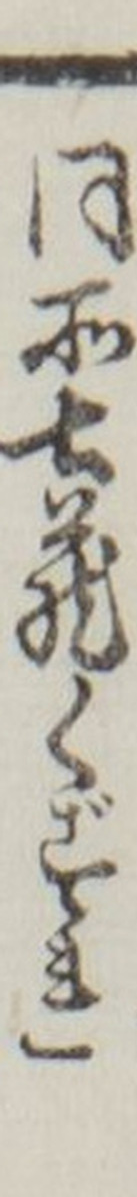同所土蔵くずれ
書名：本志らべ大阪大地震大破略記
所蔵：あいおいニッセイ同和損保株式会社
